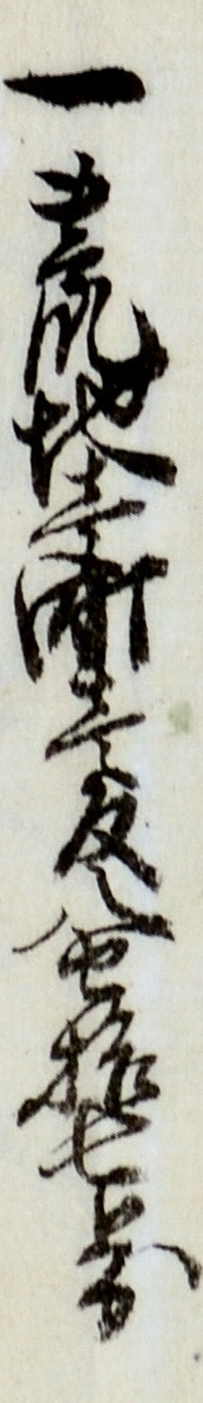一荒地壱町壱反八セ拾七歩村中
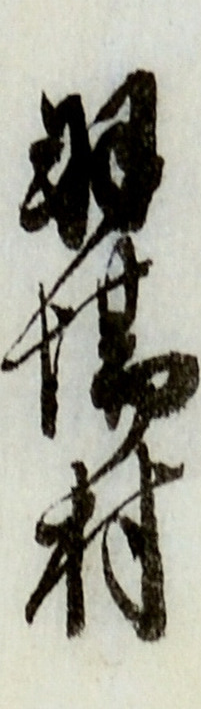羽場村
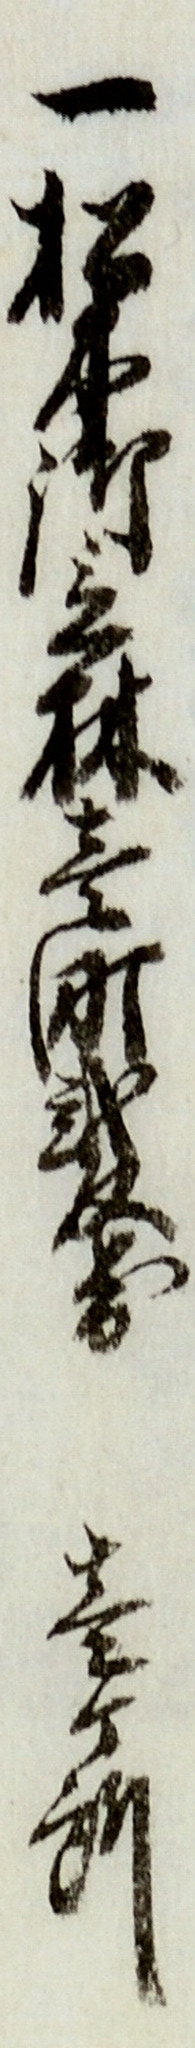一松木御立林壱町弐反歩壱ケ所
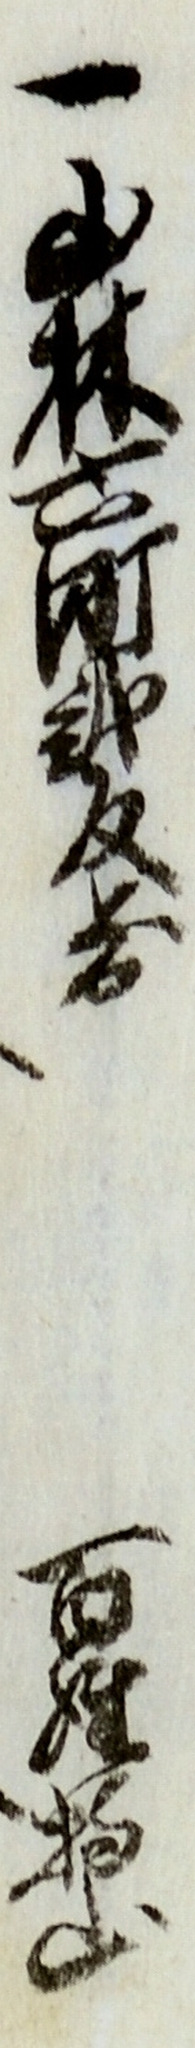一山林六町弐反歩百姓持山
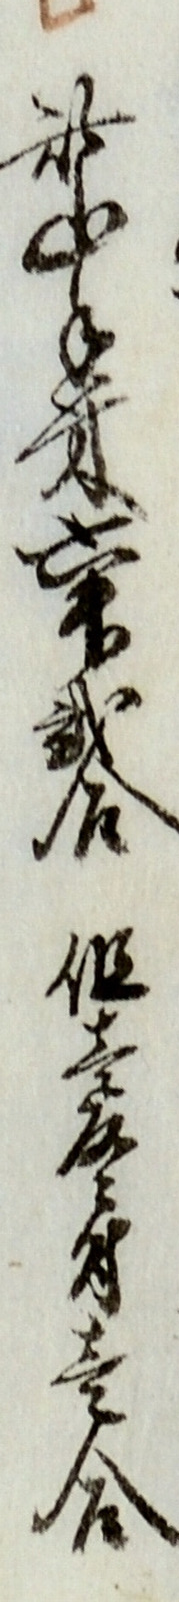☐此山手米六升弐合但壱反ニ付壱合
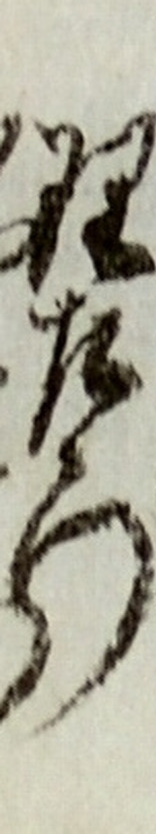理左衛門
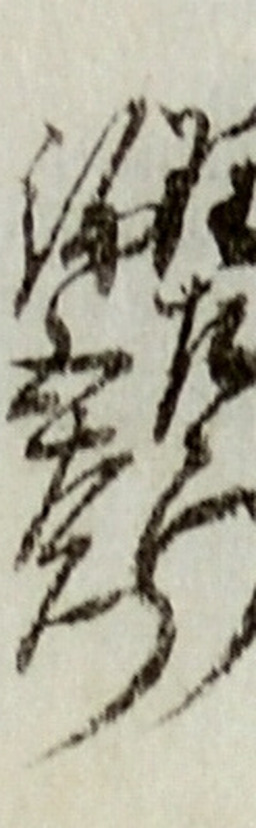弥五右衛門
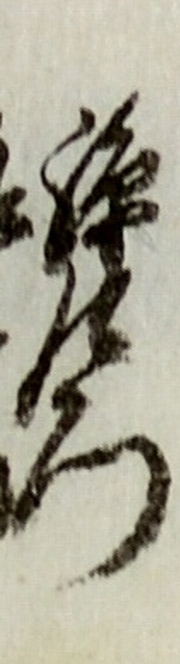理左衛門

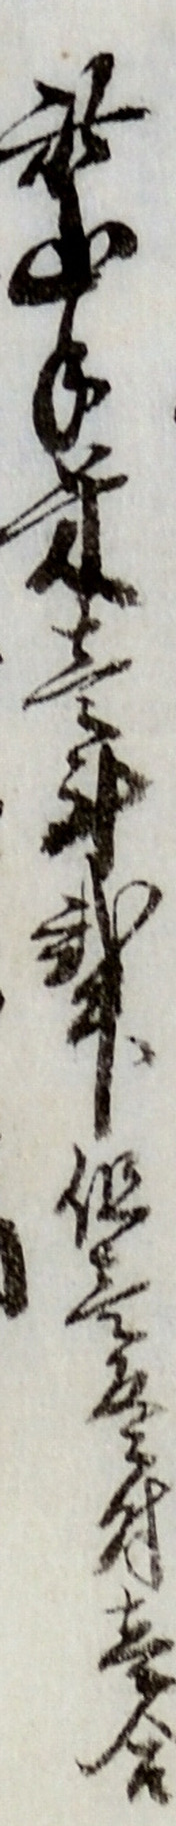此山手米壱斗弐升但壱反ニ付壱合
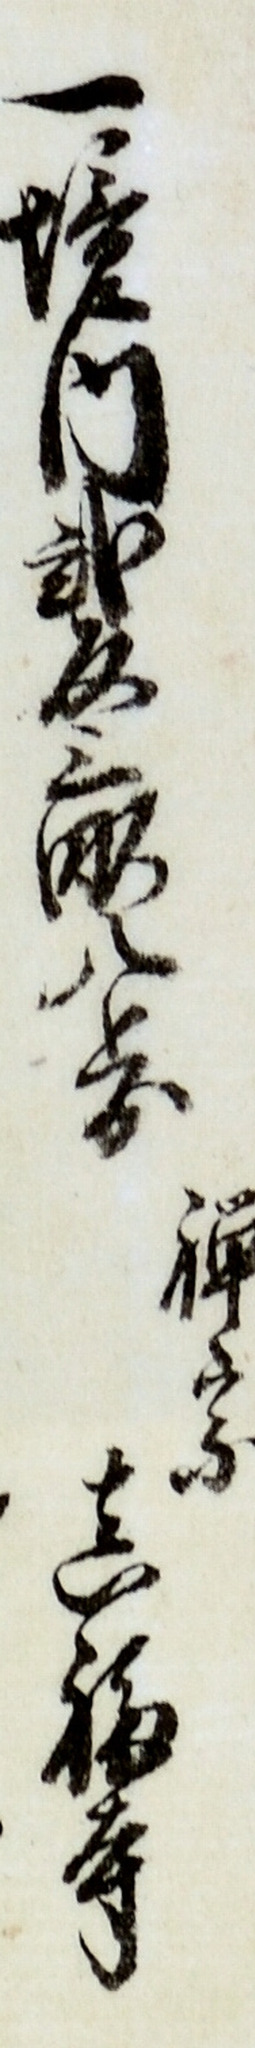一境内弐反三畝八歩真福寺
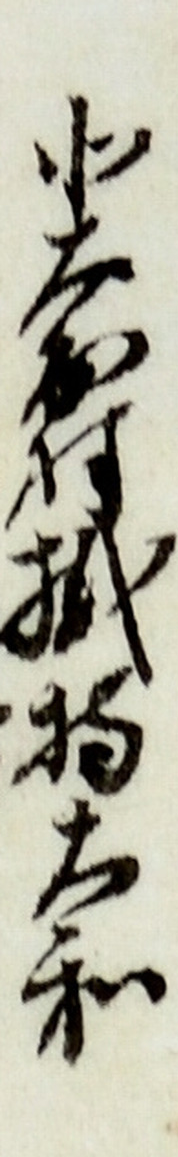北大出村掛持大和
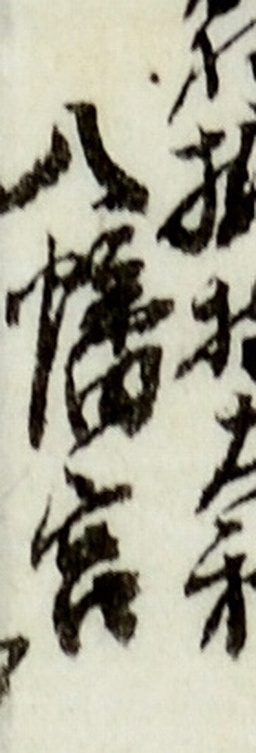八幡宮
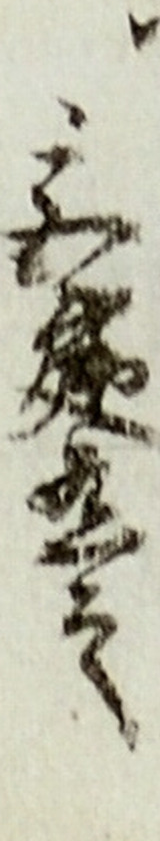宮建有之
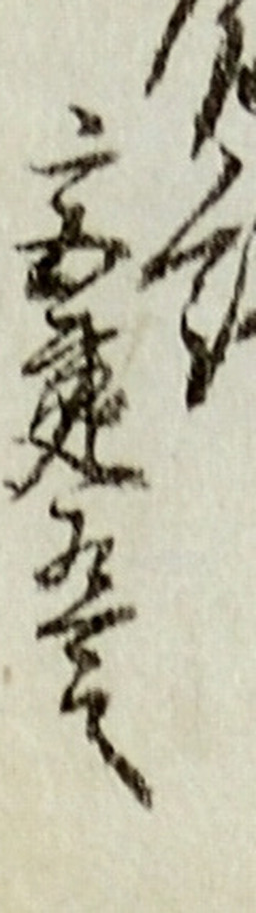宮建有之
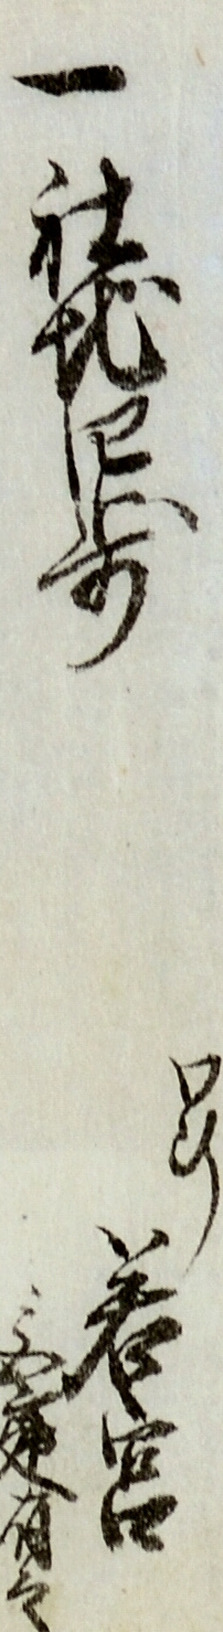一社地四歩若宮
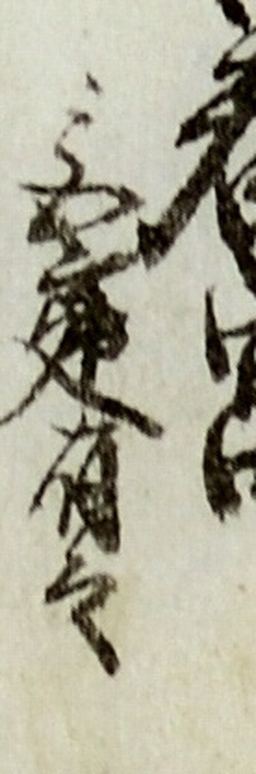宮建有之
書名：御領分中山林社地手控
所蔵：伊那市立高遠町図書館・合同会社AMANE
